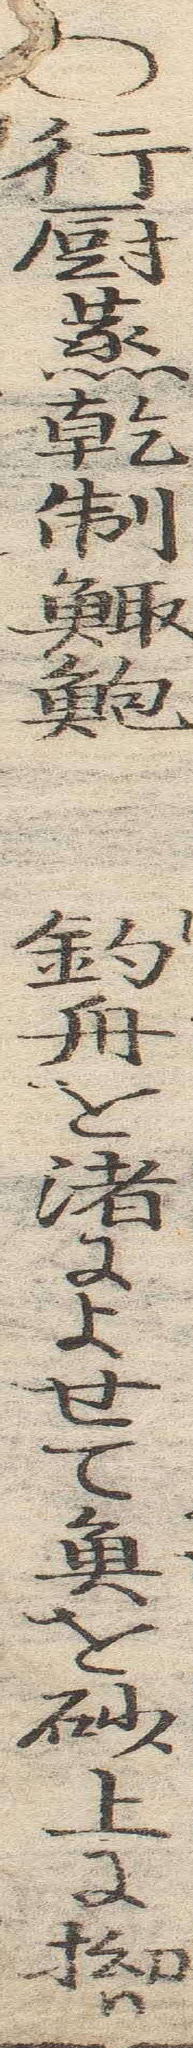○行厨蒸乾制鯫鮑釣舟を渚によせて魚を砂上に拗り
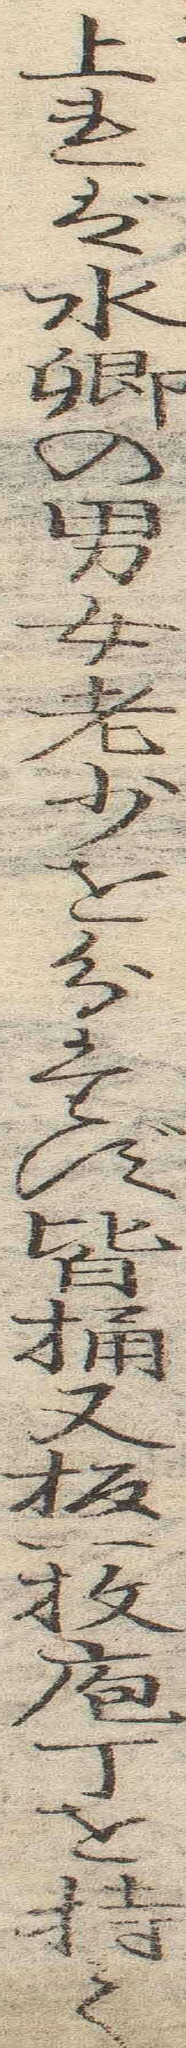上れば水卿の男女老少を分たず皆桶又板一枚庖丁を持て
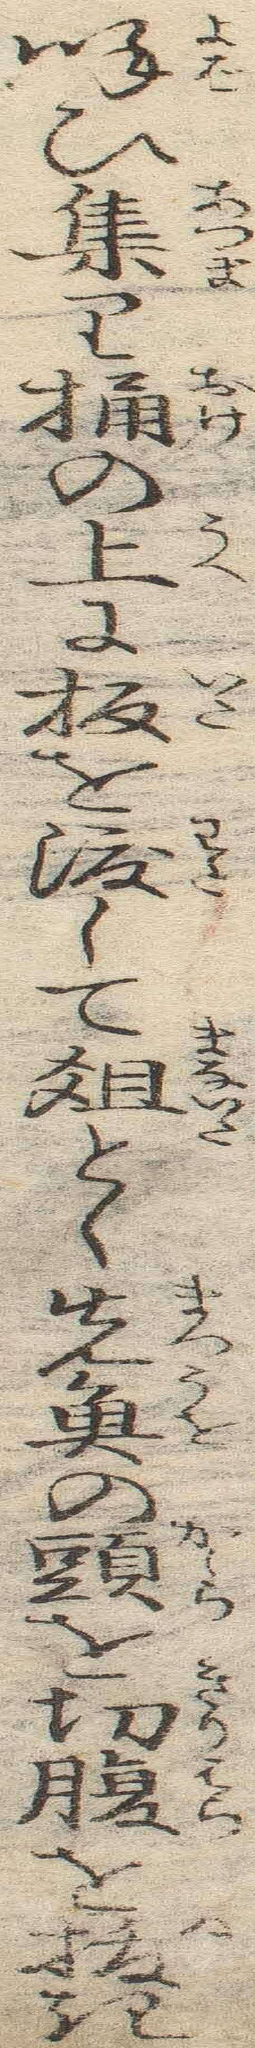呼ひ集り桶の上に板を渡して俎とし先魚の頭を切腹を抜き
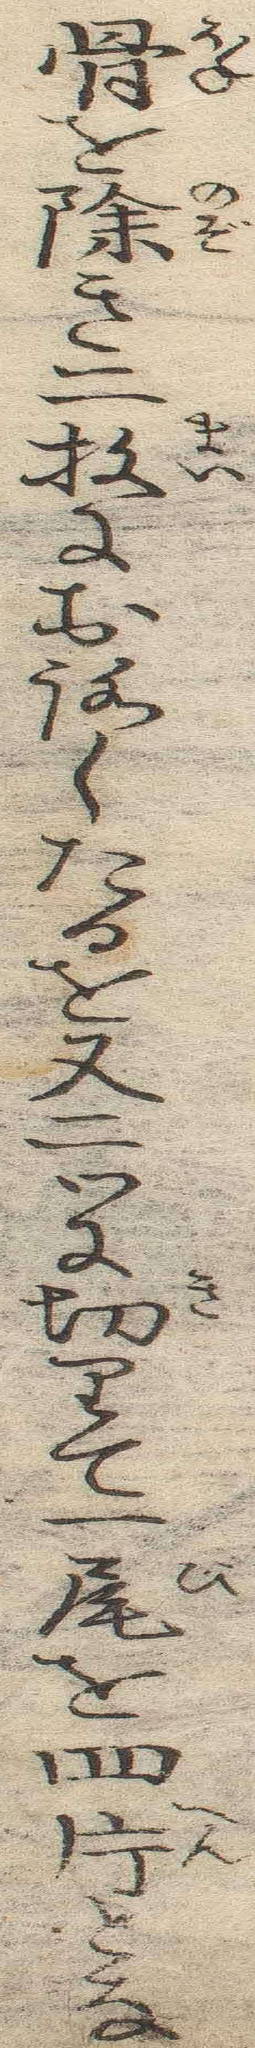骨を除き二枚におろしたるを又二ッに切りて一尾を四片とな
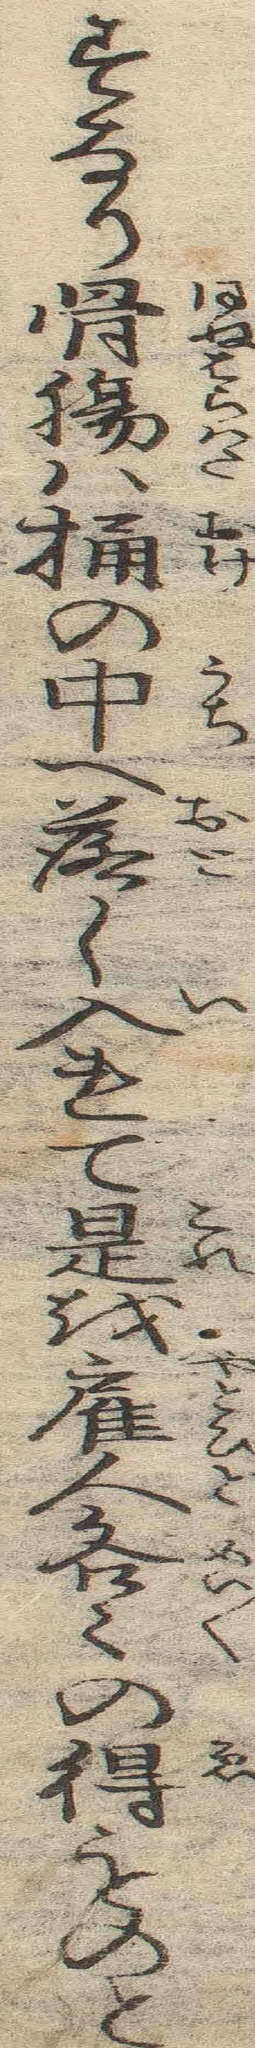すなり骨腸は桶の中へ落し入れて是を雇人各々の得ものと

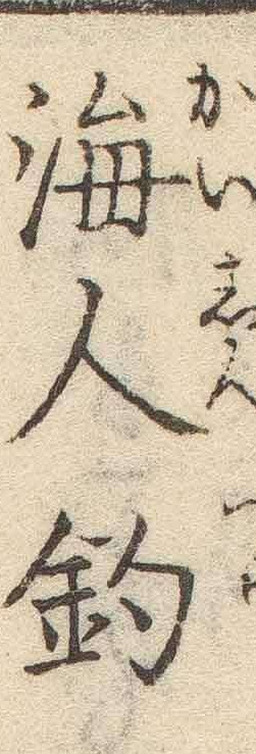海人釣
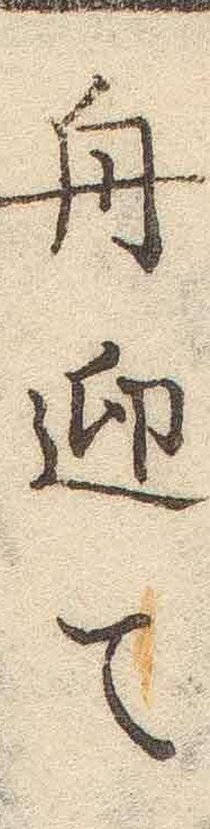舟迎て
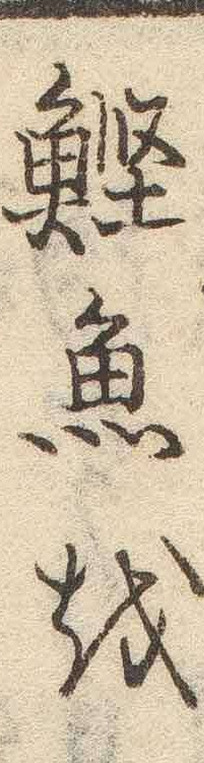鰹魚を
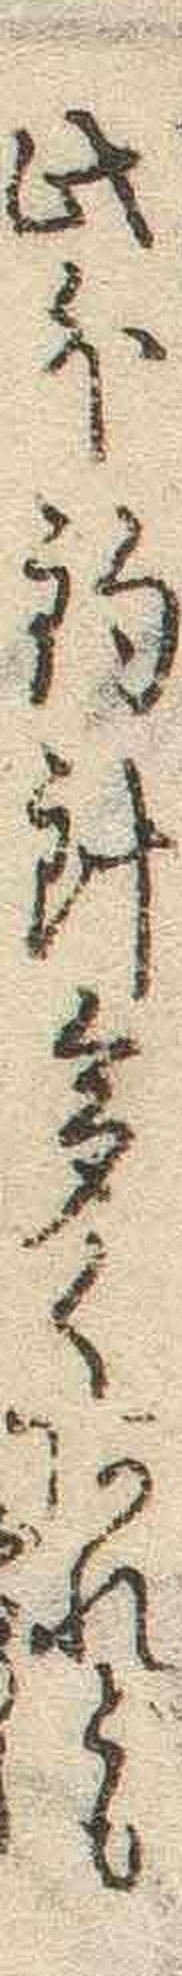此外釣針多くあれども
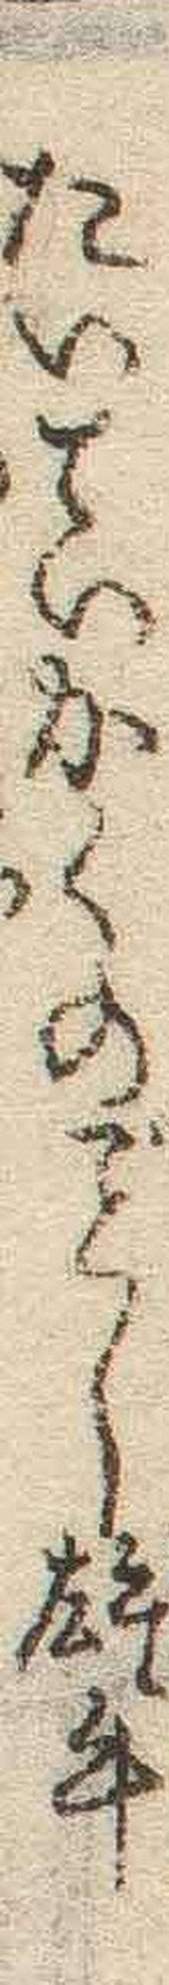たいていかくのごとし雄牛
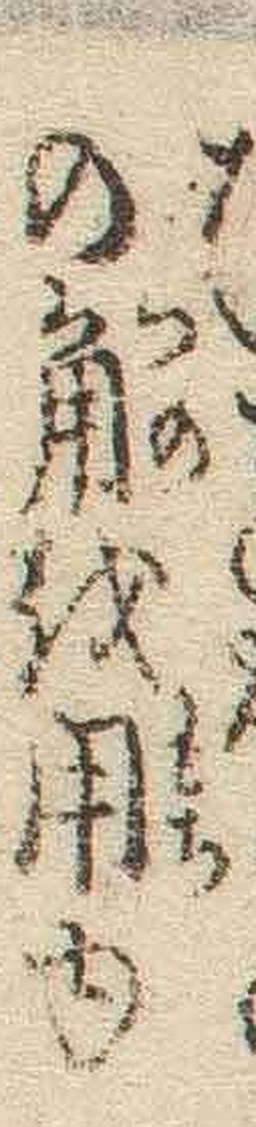の角を用ゆ
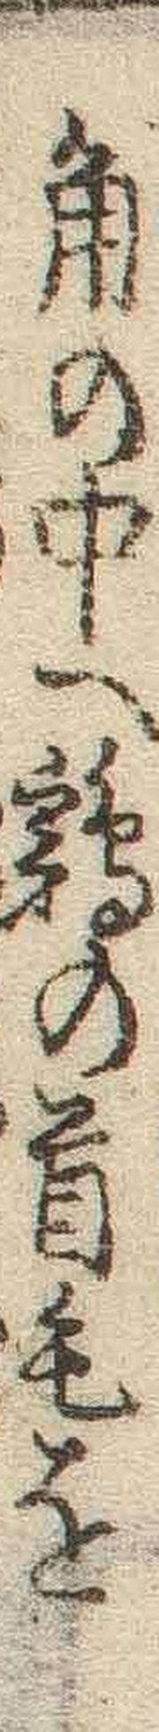角の中へ鶏の首毛を
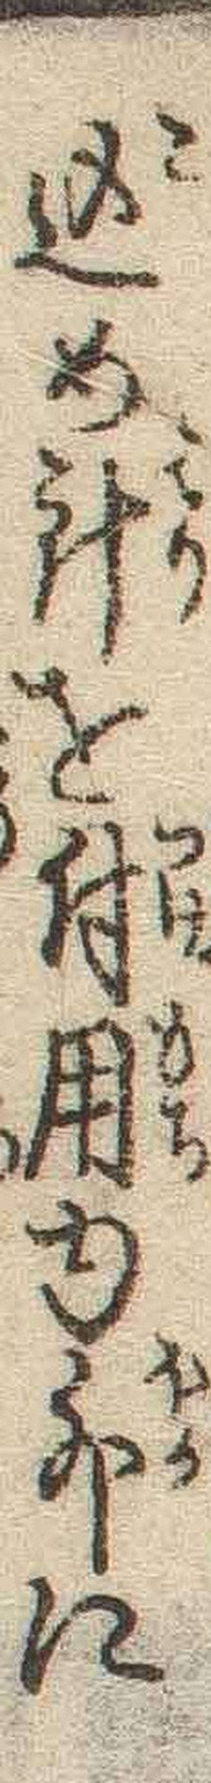込め針を付用ゆ外に
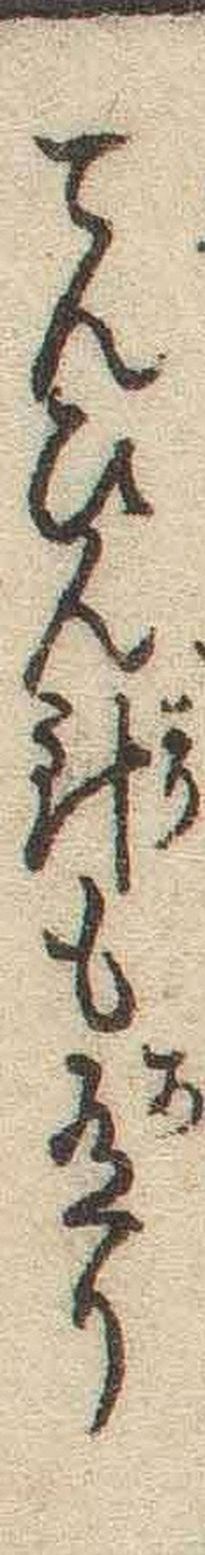てんひん針も有り

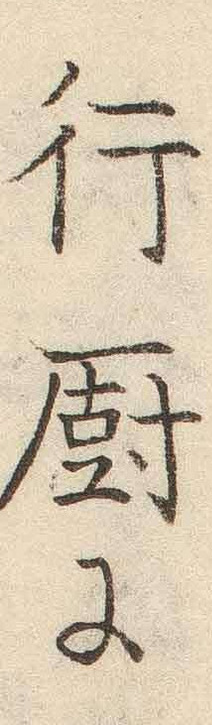行厨に
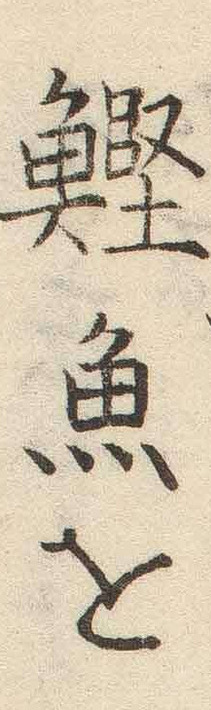鰹魚を
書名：日本山海名産図会
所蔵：東京学芸大学附属図書館 国文学研究資料館
